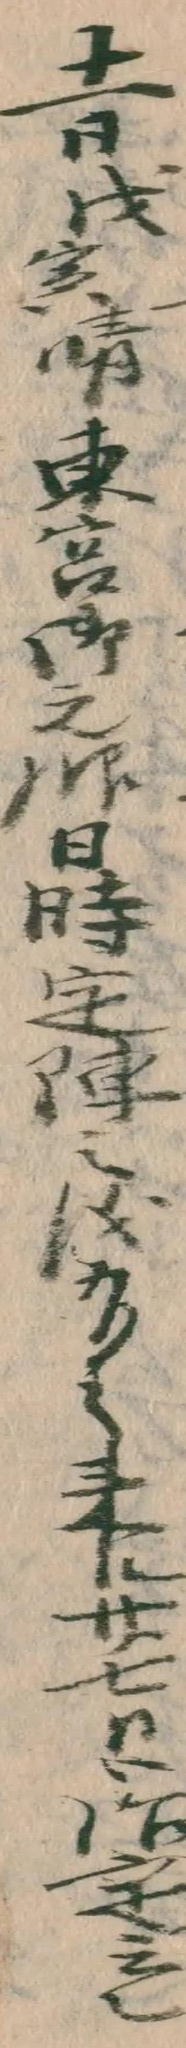十一日戊寅晴東宮御元服日時定陣之儀有之来ル廿七日御治定云々
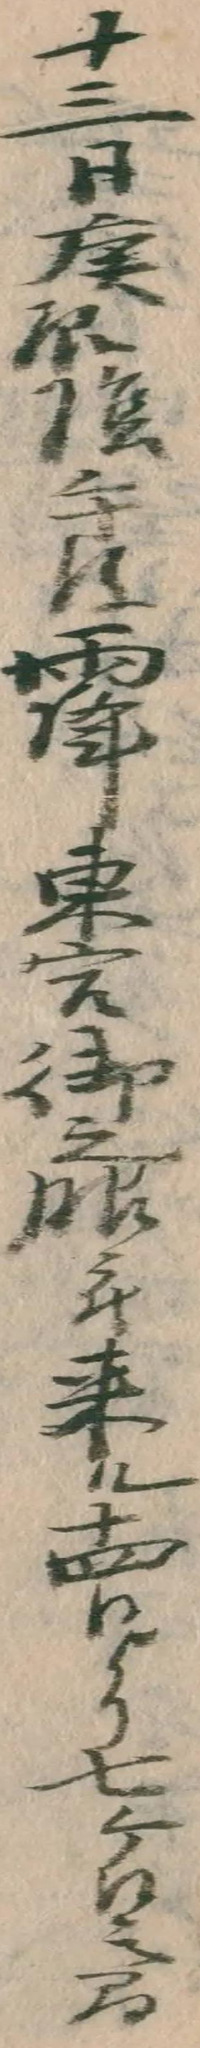十三日庚辰陰午後雨降東宮御元服ニ付来ル十四日より七ケ日之間
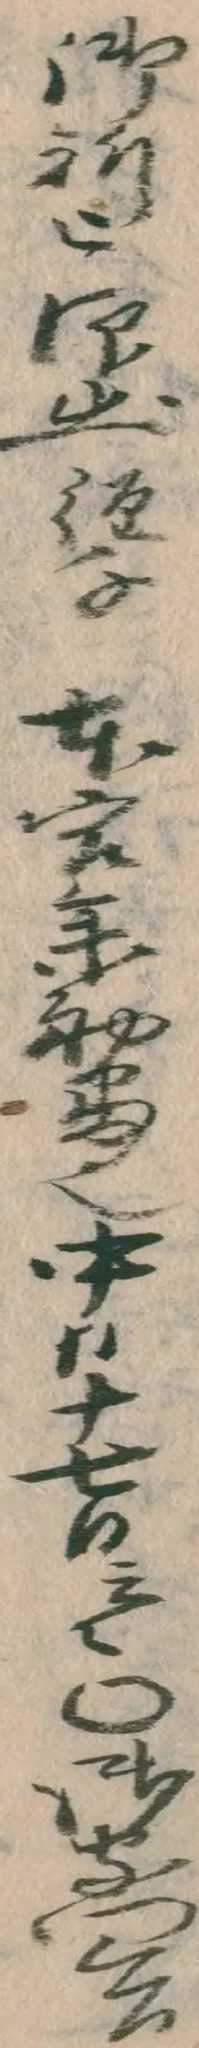御祈祷被仰出経千本宮参勤番也中日十七日云々○御家門今日
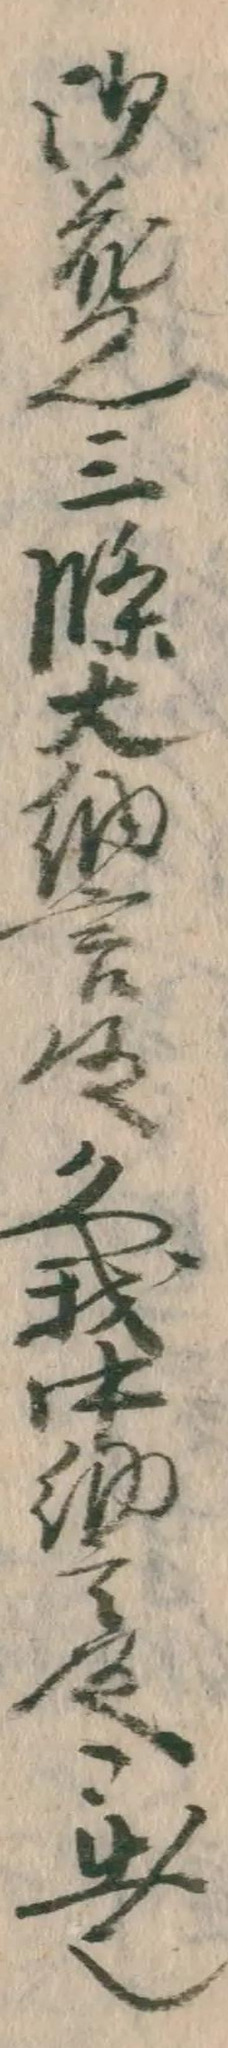御花見三條大納言殿久我中納言殿御出也
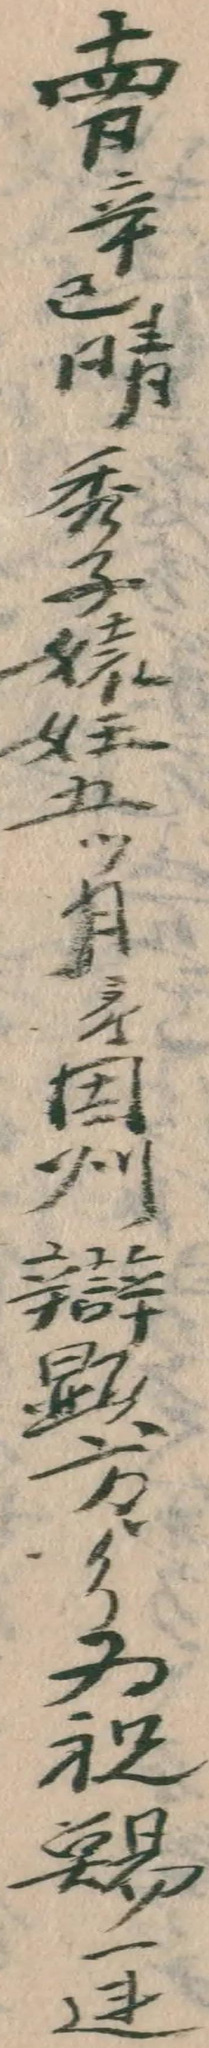十四日辛巳晴秀子妊五ツ月ニ付因州辨顕方より為祝鯣一連
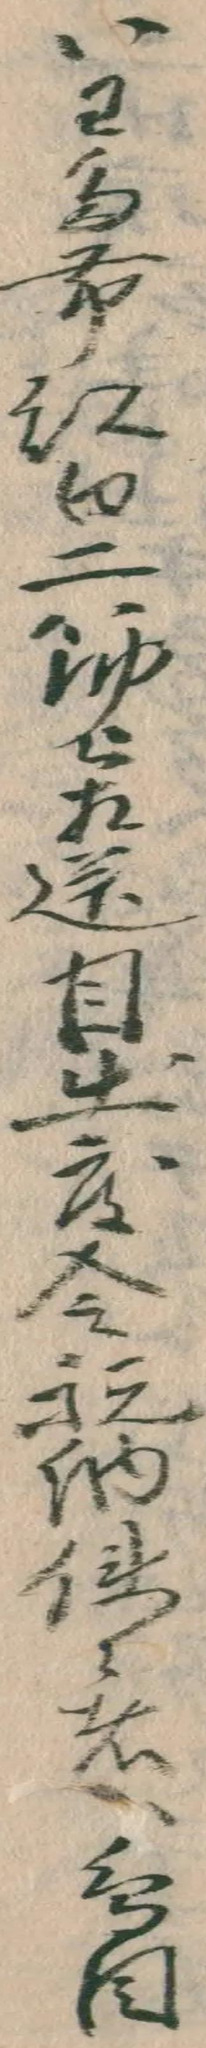いわた布紅白二筋被相送目出度令祝納使之者へ鳥目
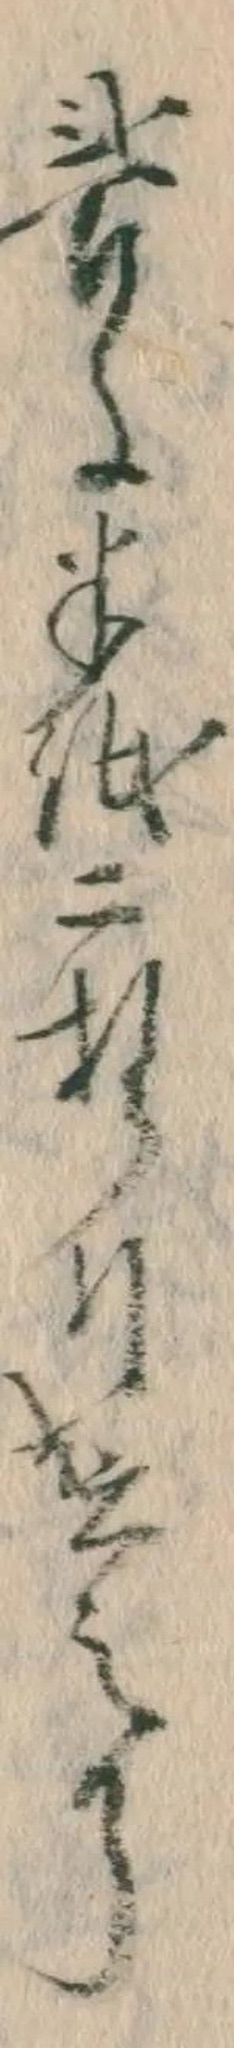弐百文半紙二折引遣之了
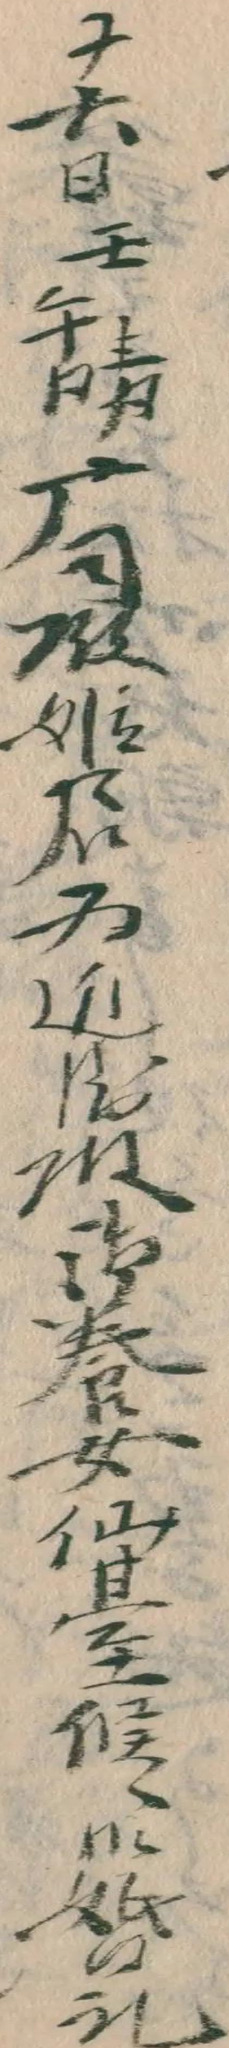十六日壬午晴广司殿姫君為近衛殿御養女仙臺侯へ御婚礼
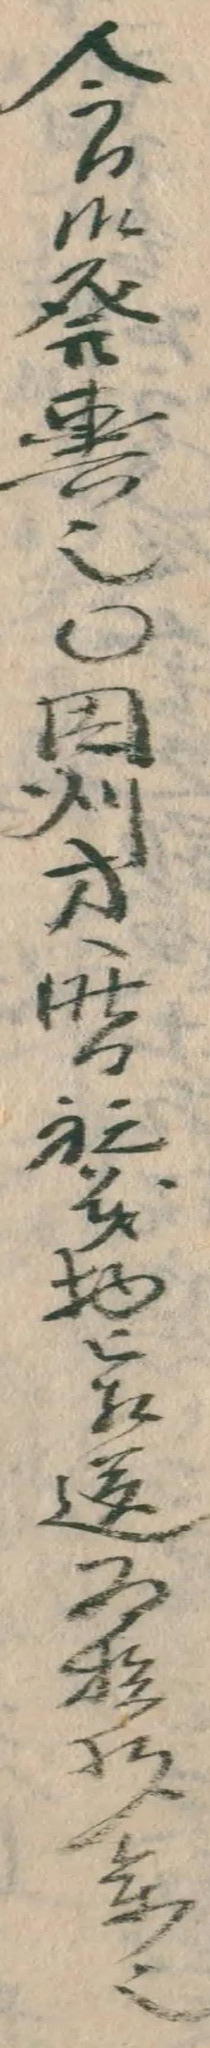今間御発輿也○因州方へ昨日祝義物被る送為挨拶参也
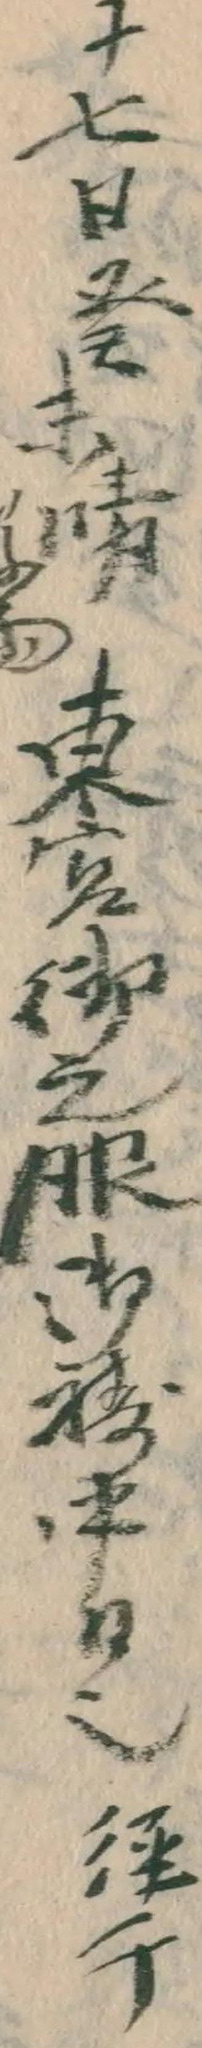十七日癸未晴後雨東宮御元服御祷中日也経千

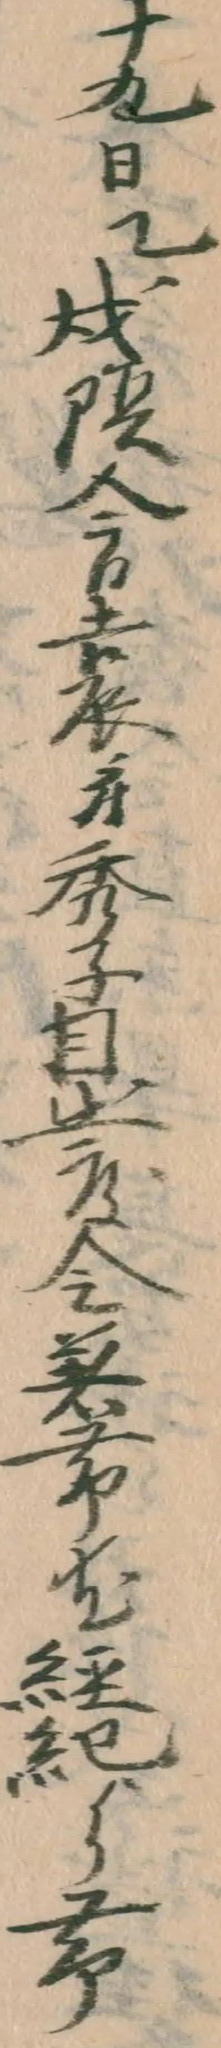十九日乙戌陰今日吉辰ニ付秀子目出度着帯尤経紀より帯
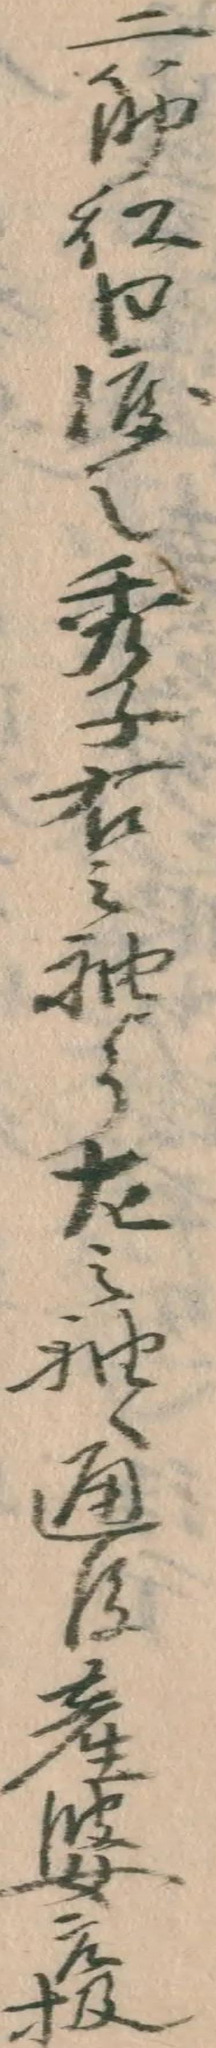二筋紅白渡也秀子右之袖より左之袖へ通後産婆取扱
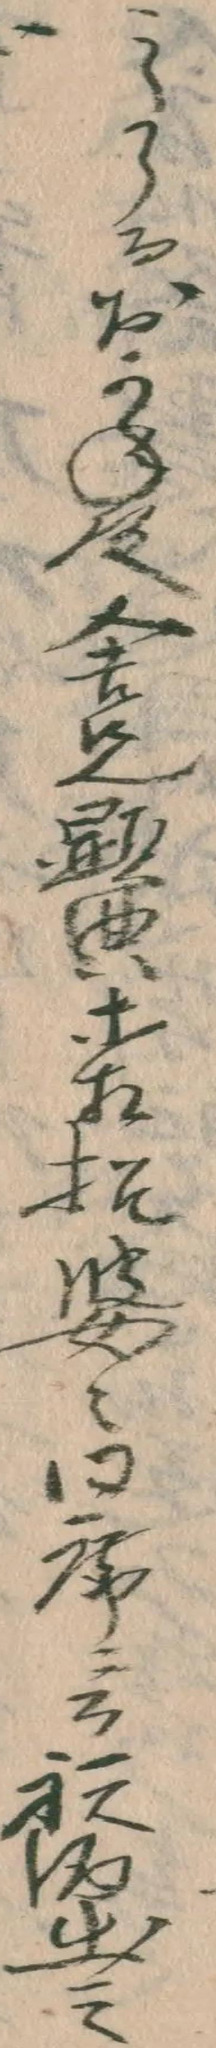之了而おかね殿舎兄顕典等相招婆々同席ニ而祝酒出之
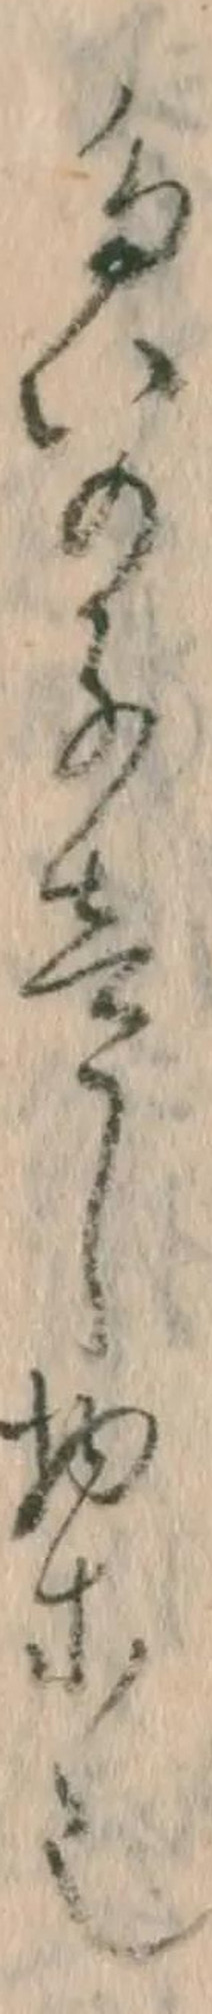たいの子ひたし物等也
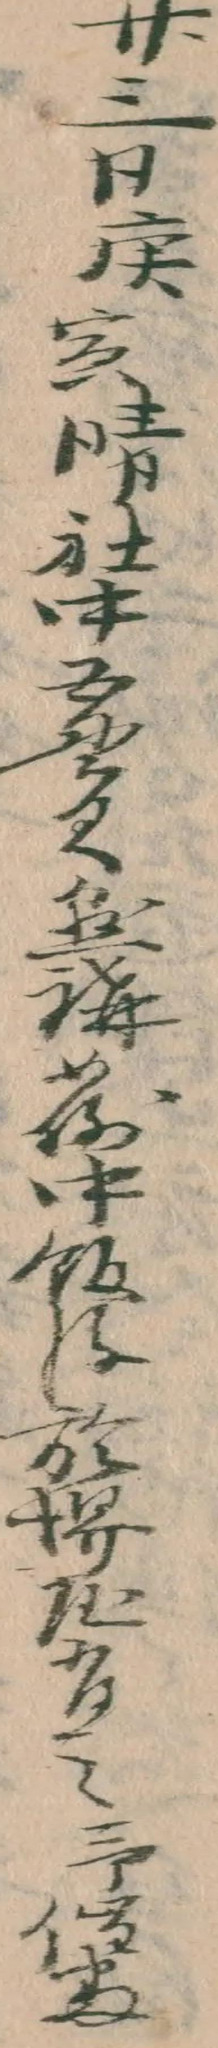廿三日庚寅晴社中五貫匁懸講如例中飯後堺屋有之予催番
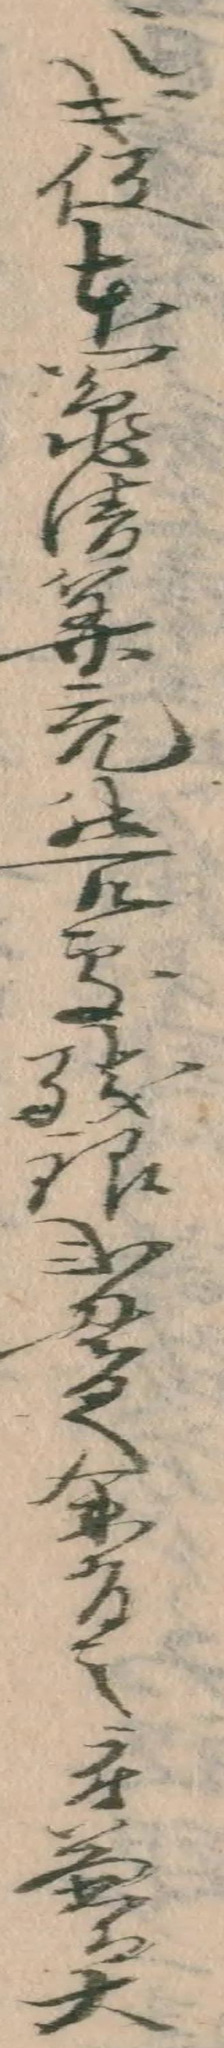也出役本鬮清算充然候處残銀弐佰匁余有之ニ付兼而大
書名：賀茂社記録. 第69冊
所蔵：国立国会図書館 National Diet Library, JAPAN
